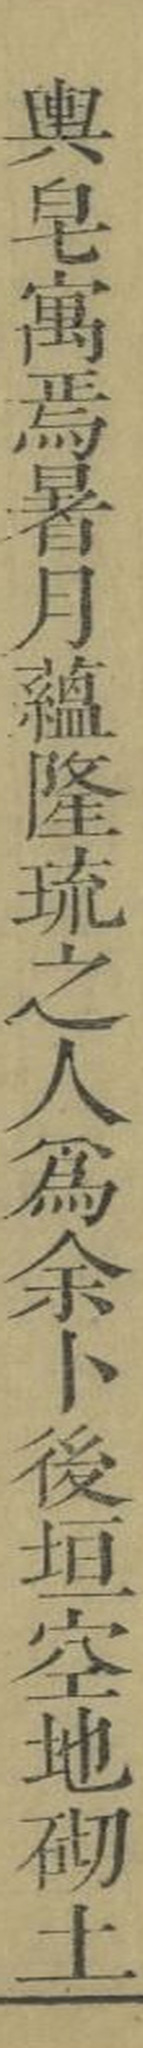輿皂寓焉暑月蘊隆琉之人爲余卜後垣空地砌土
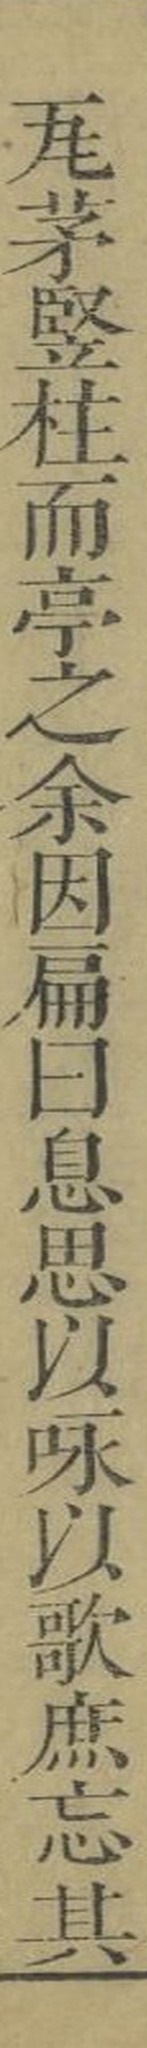瓦茅竪柱而亭之余因扁曰息思以咏以歌庶忘其
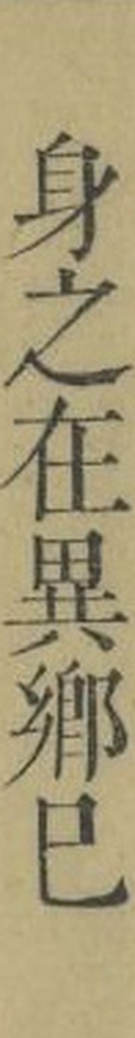身之在異鄕巳
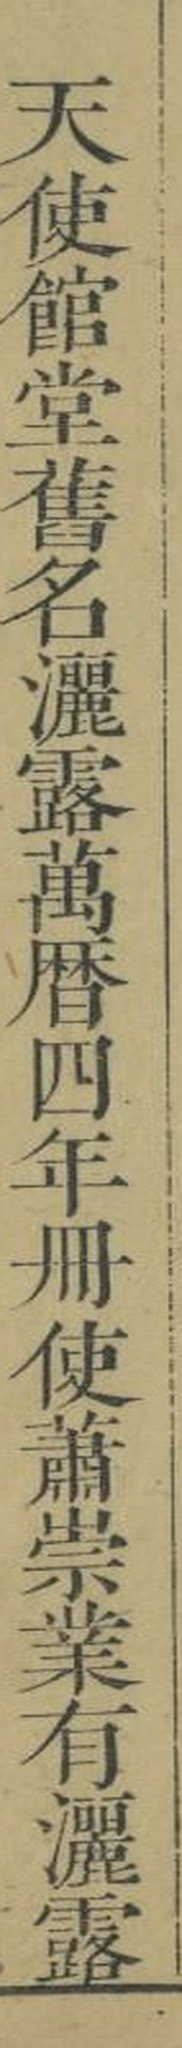天使館堂舊名灑露萬暦四年冊使蕭崇業有灑露
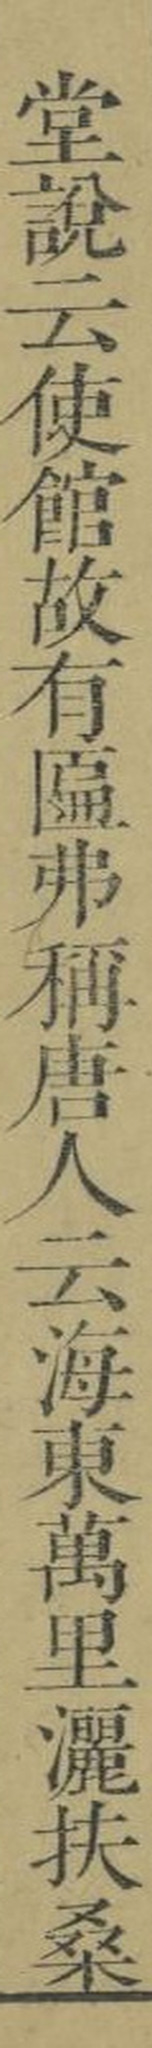堂說云使館故有匾弗稱唐人云海東萬里灑扶桑
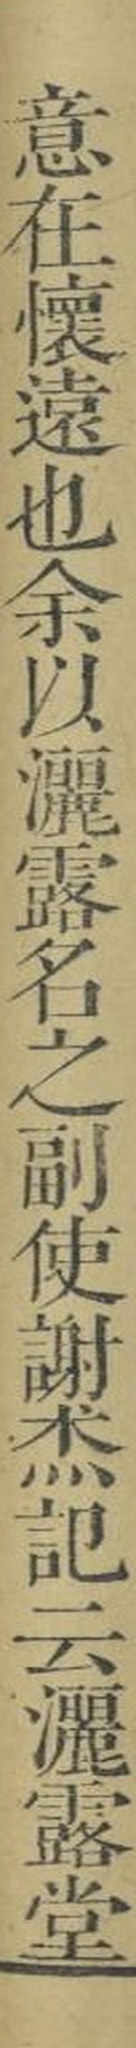意在懷遠也余以灑露名之副使謝杰記云灑露堂
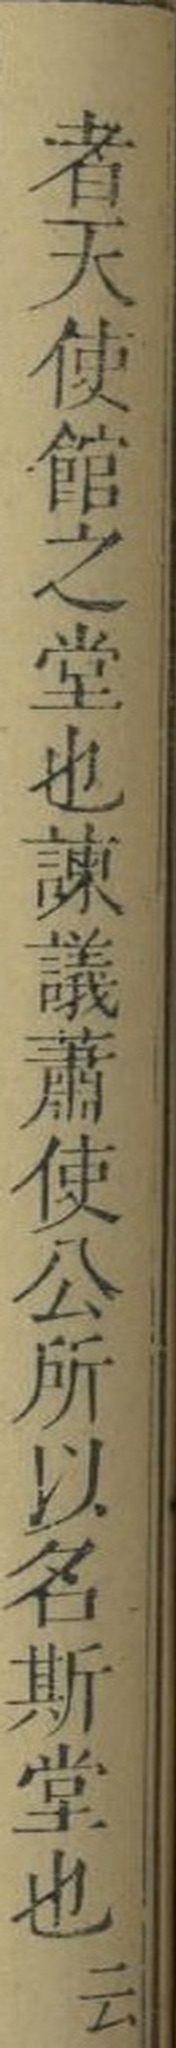者天使館之堂也諫議蕭使公所以名斯堂也云云
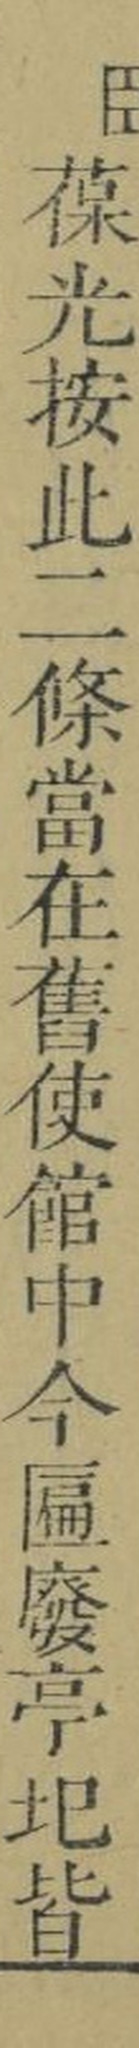臣葆光按此二條當在舊使館中今匾廢亭圯皆
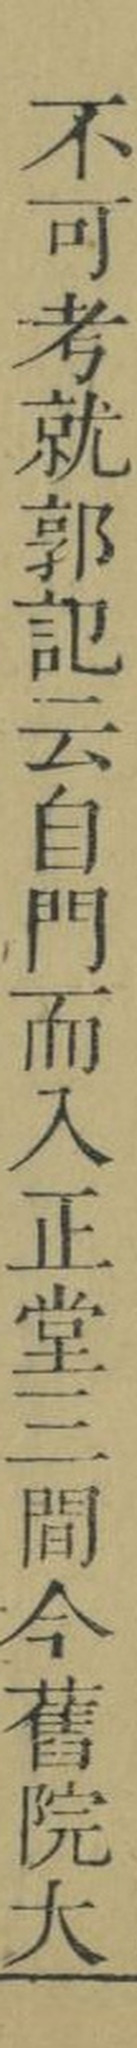不可考就郭記云自門而入正堂三間今舊院大
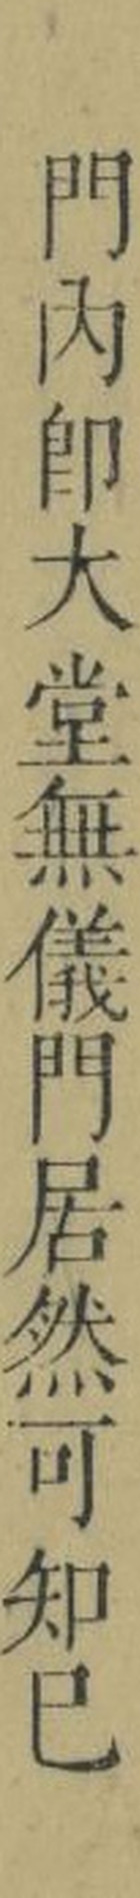門内卽大堂無儀門居然可知巳
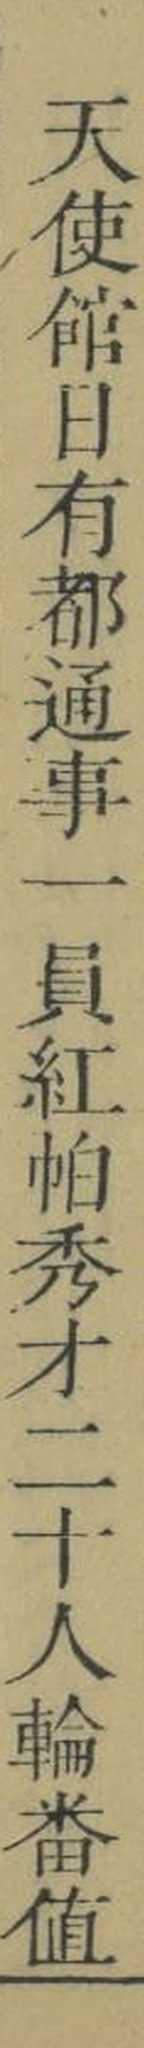天使館日有都通事一員紅帕秀才二十人輪畨値
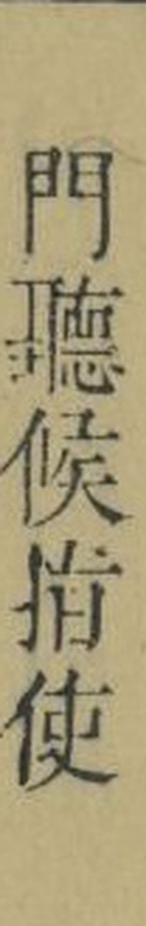門聽候指使
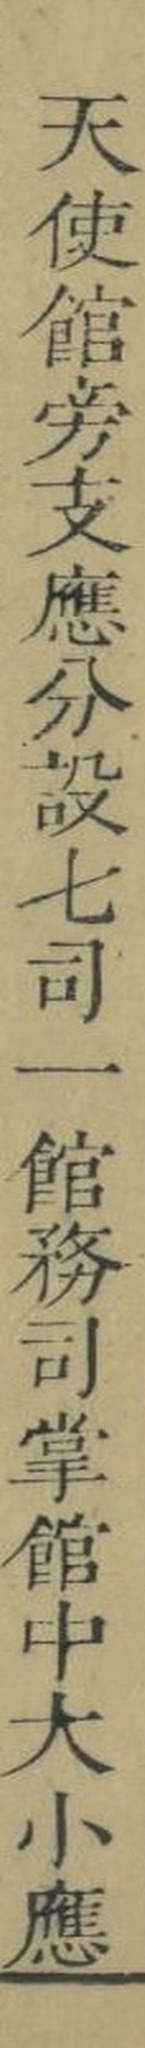天使館旁支應分設七司一館務司掌館中大小應
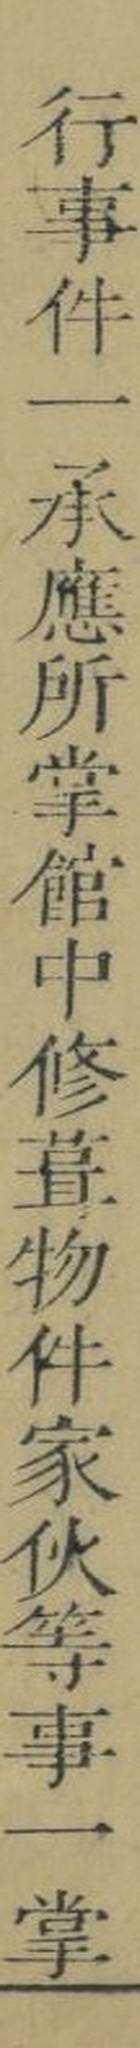行事件一承應所掌館中修葺物件家伙等事一掌
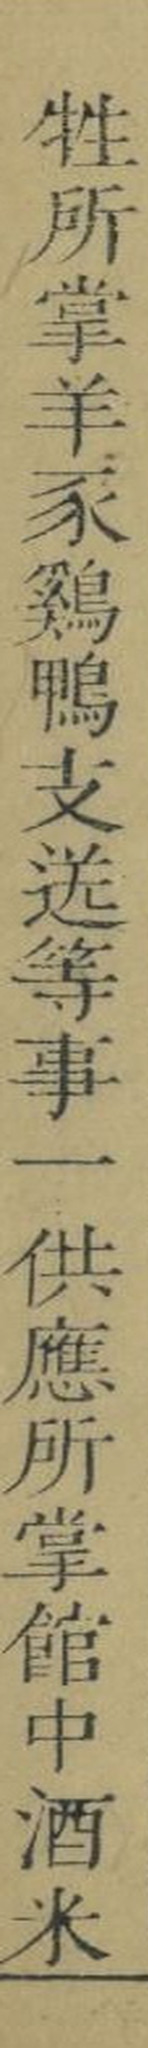牲所掌羊豕鷄鴨支送等事一供應所掌館中酒米

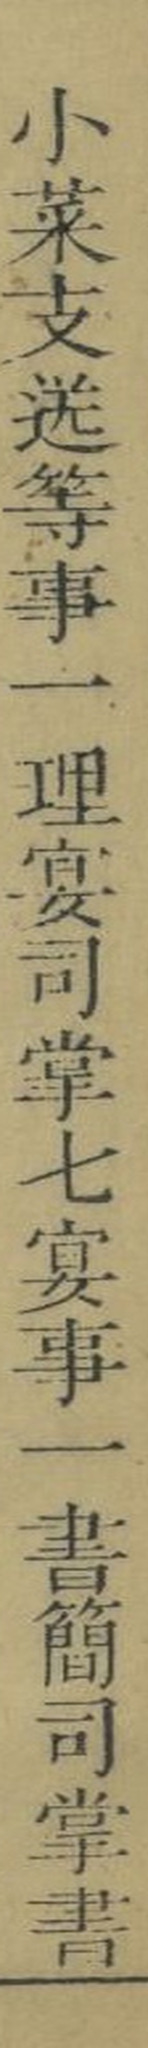小菜支送等事一理宴司掌七宴事一書簡司掌書
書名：中山伝信録 巻二
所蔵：University of the Ryukyus Library
